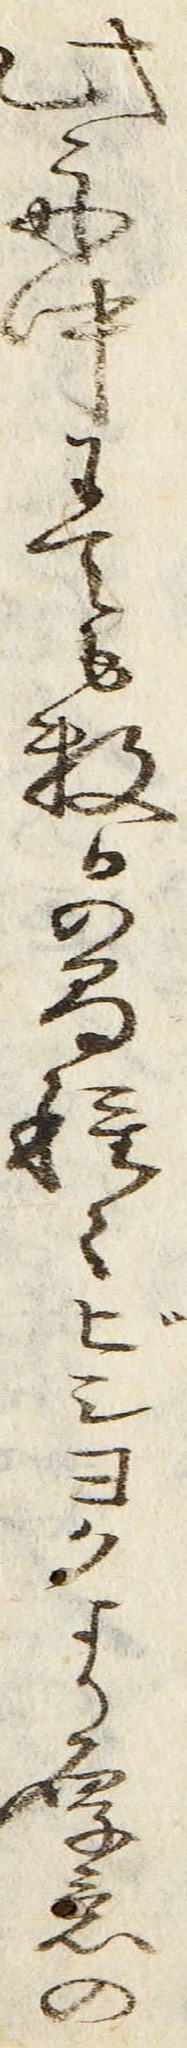此舟中にても数日の間種々ビシヨクより厚意の
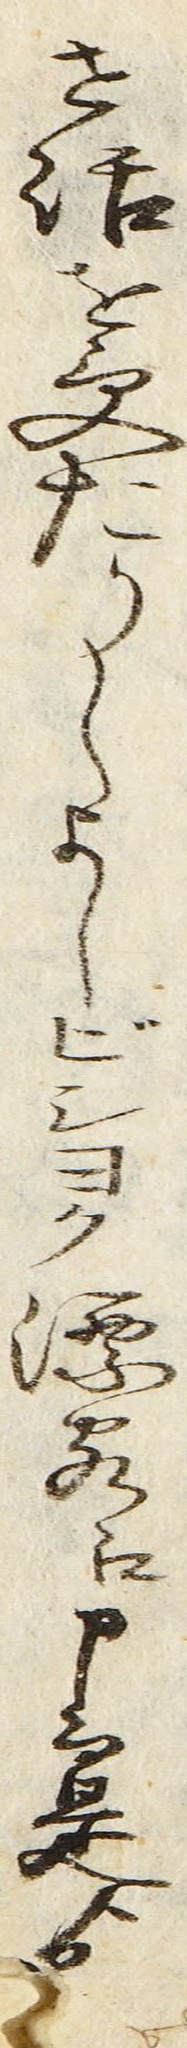世話を受たりしよしビシヨク漂客え申而是ゟ
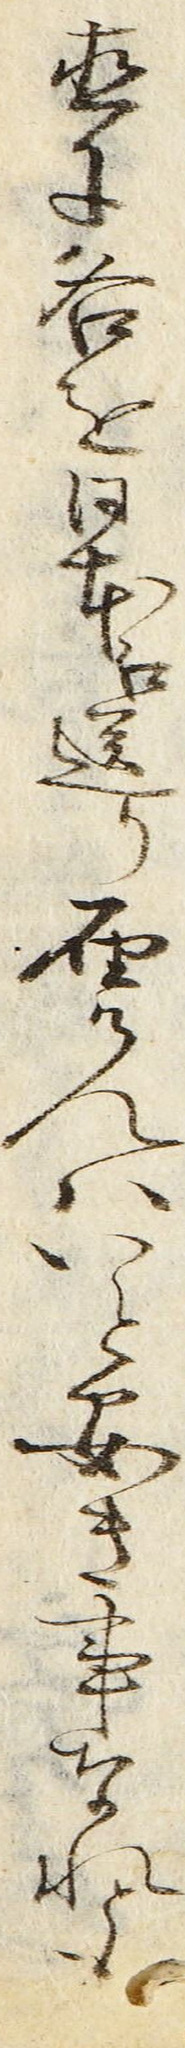直に各を日本え送り届けんハいと安き事なれとも

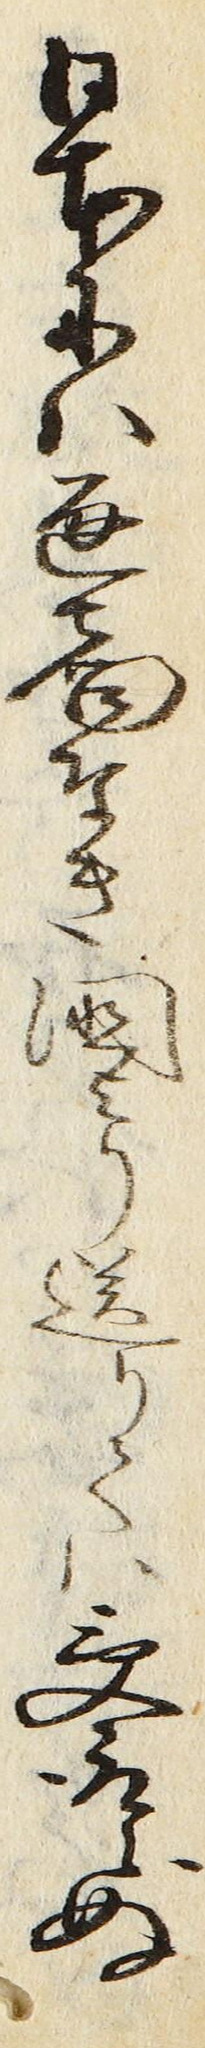日本にハ通商なき国より送りてハ受取らぬ
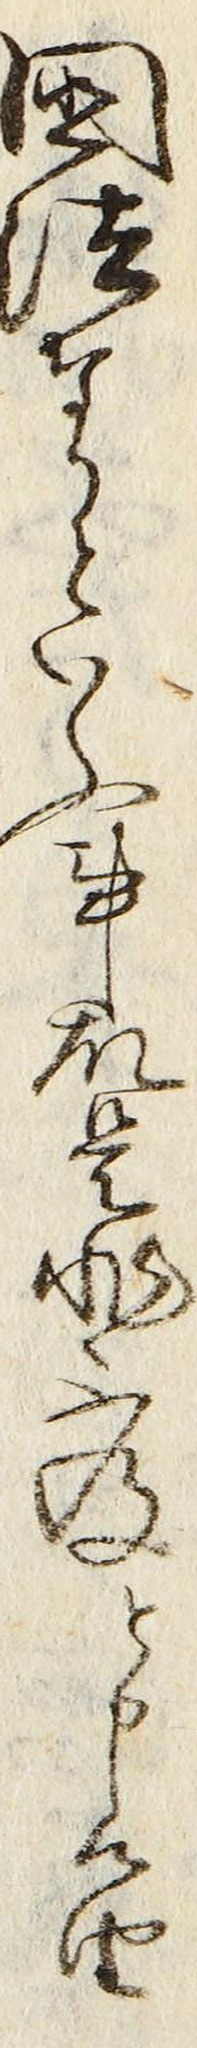国法なりといふ事故是非不及と申候由
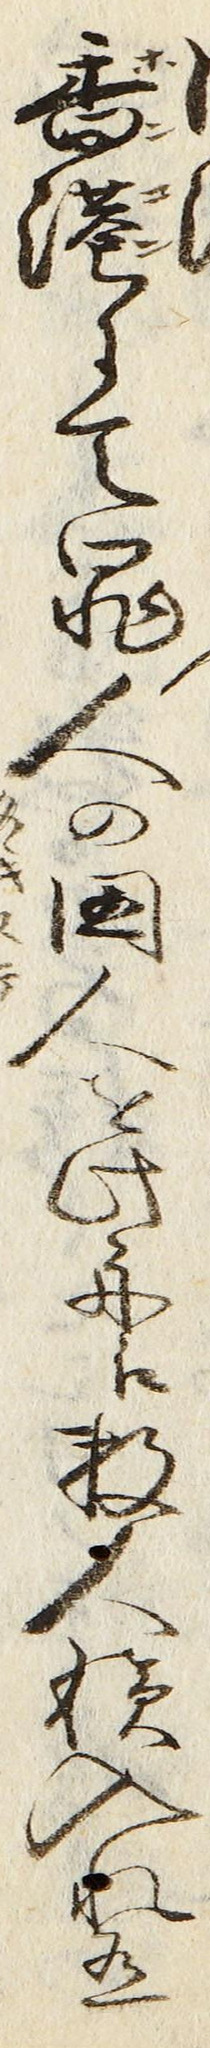香港にて罪人の囚人を此舟え数人積入れ有
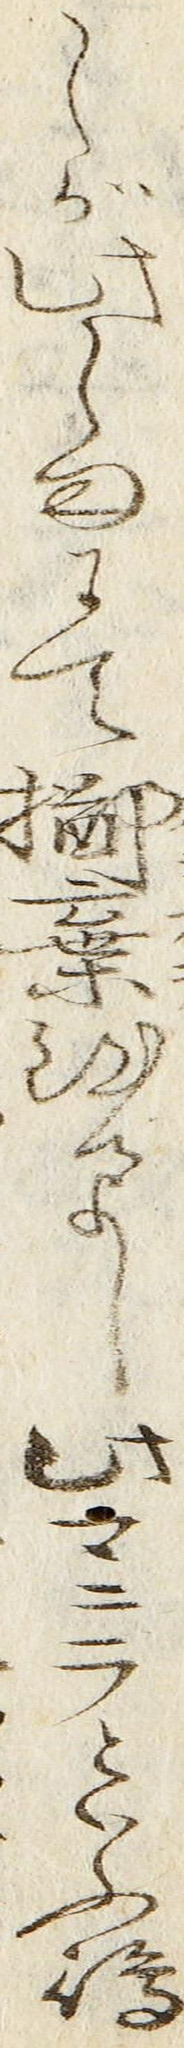しが此しまにて擲棄致候よし此マニラといふ島
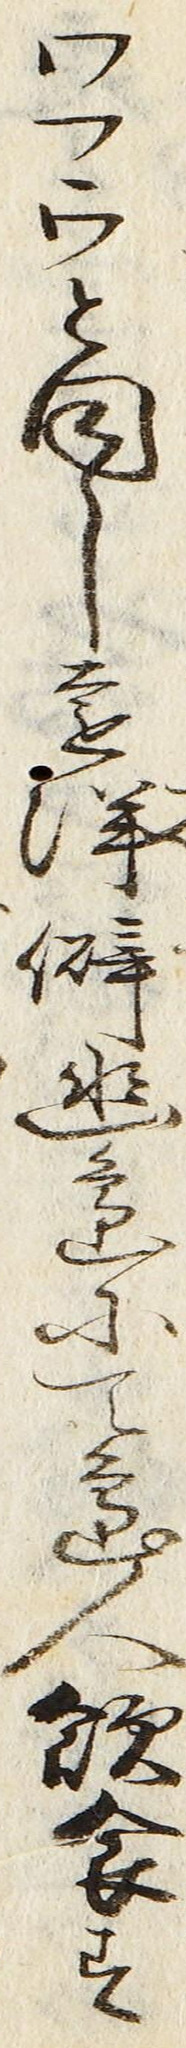ワフウと同し遠洋僻幽島にて島人飲食す
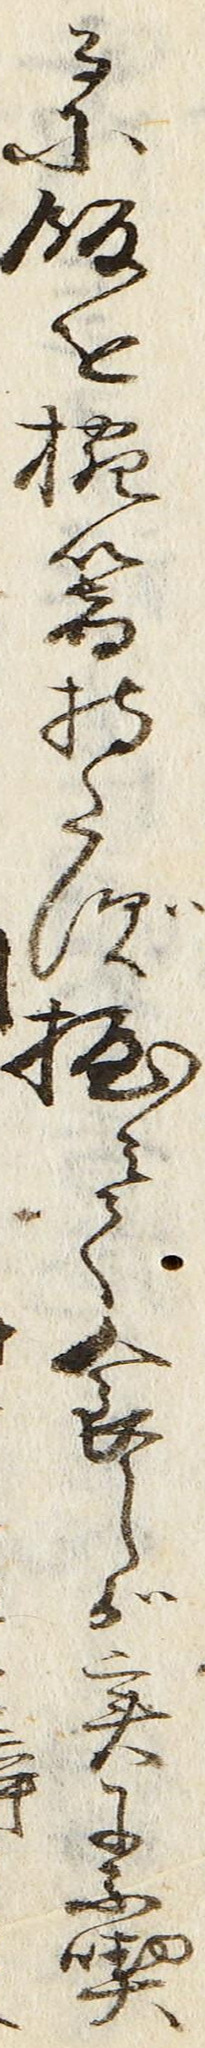るに飯を椀箸持たず握ミて食しが実に不喫
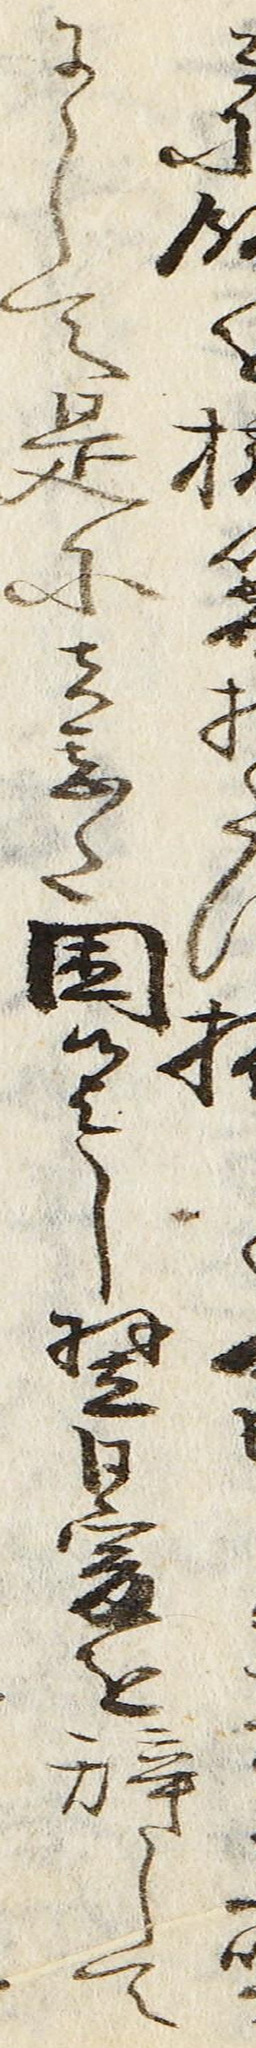にして是には甚た困候よし翌日爰を辞して
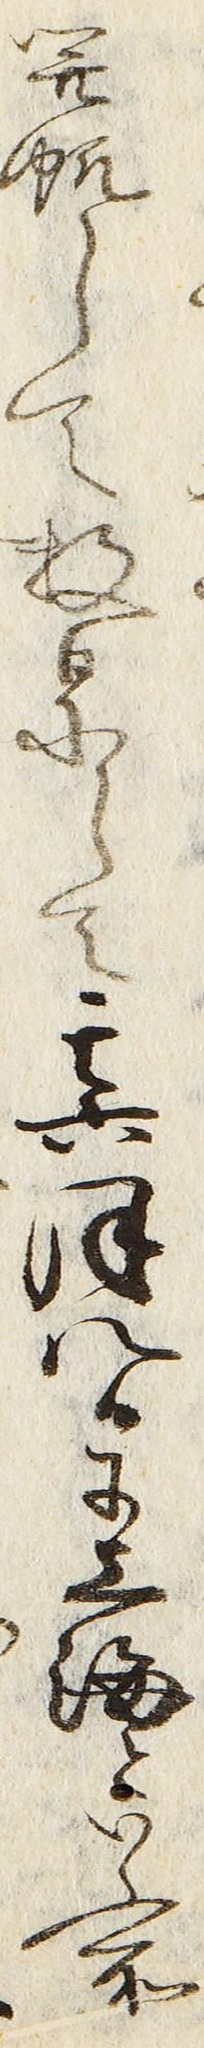開帆して数日にして其六月八日に上海といふ所
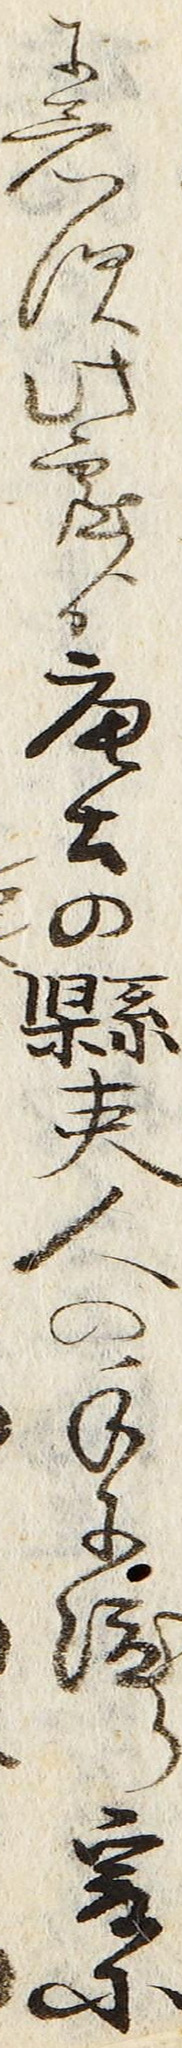に着す此処ゟ唐土の県吏人の手に渡り爰に
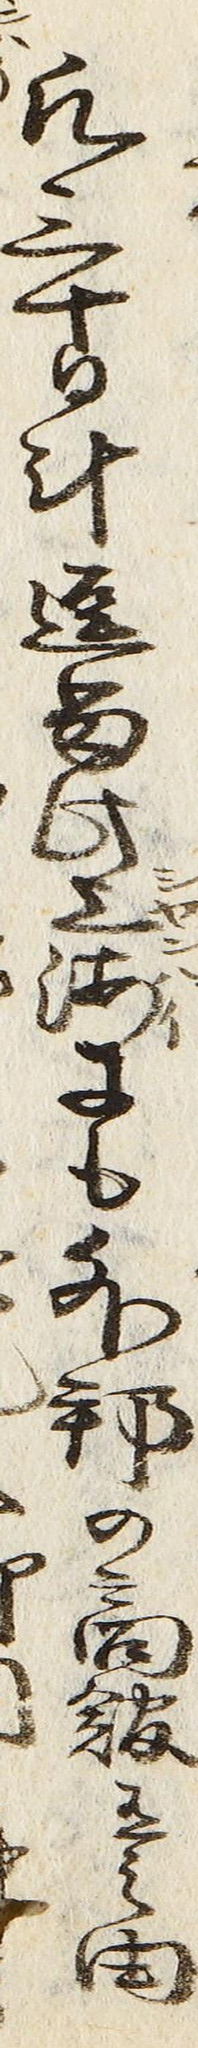凡三十日計逗留此上海にも外邦の商館有之由
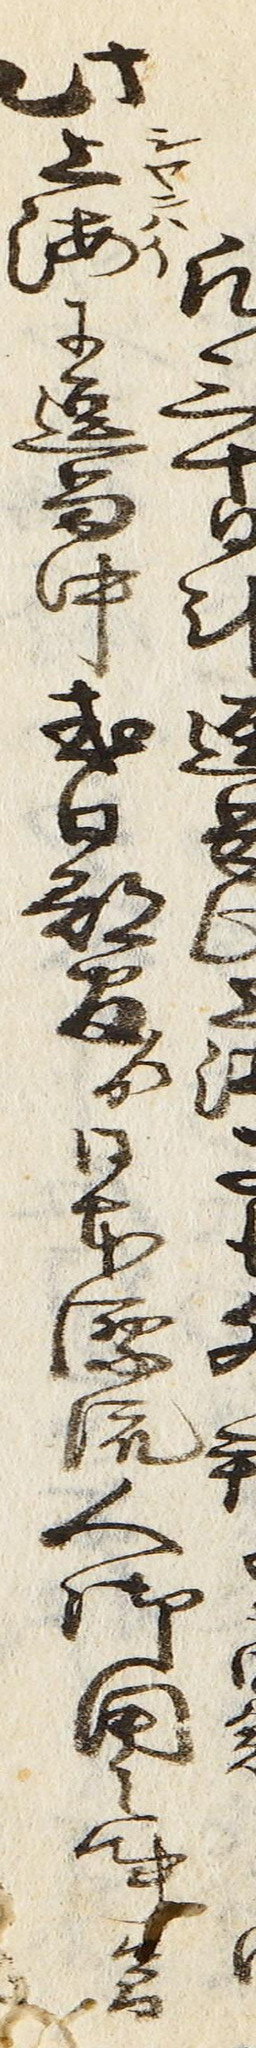此上海に逗留中或日郡官ゟ日本漂流人御用の書簡
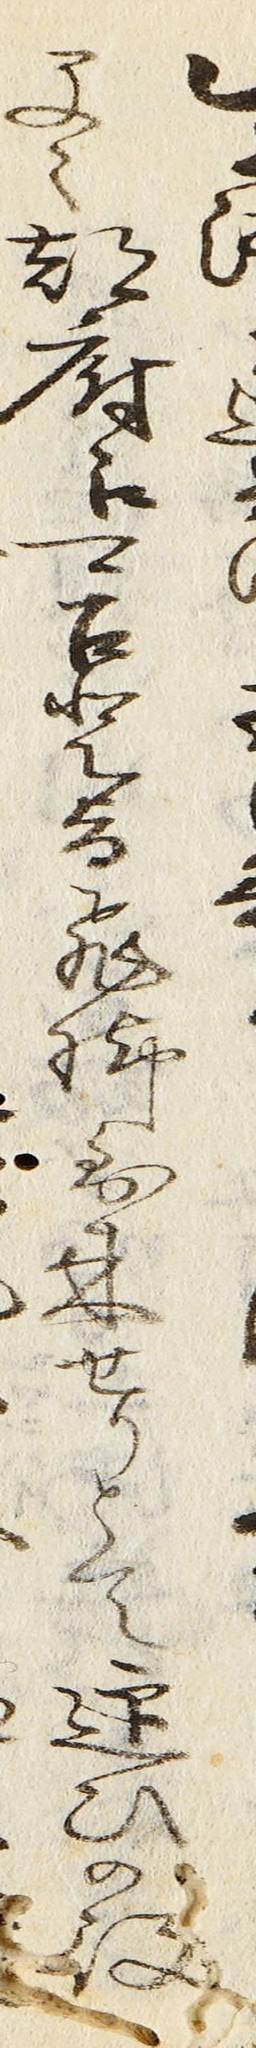早々都府え可召登旨飛脚到来せりとて迎ひの役
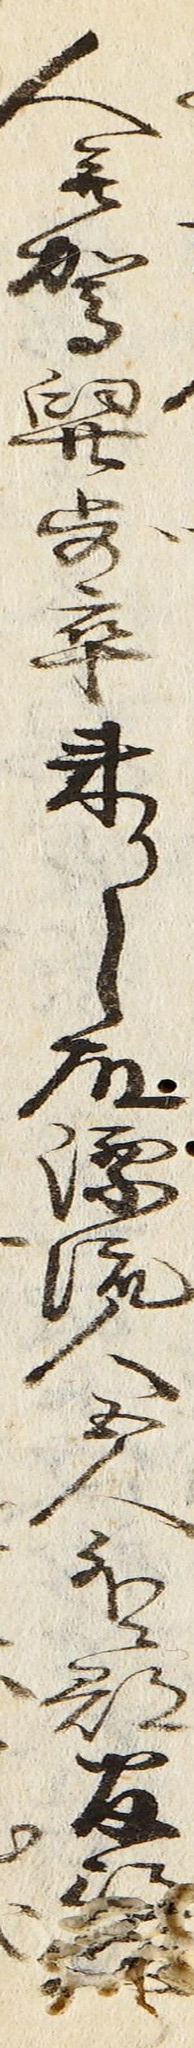人并駕舁歩卒来りし故漂流人五人外ニ郡官役
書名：亜墨利加漂流記聞
